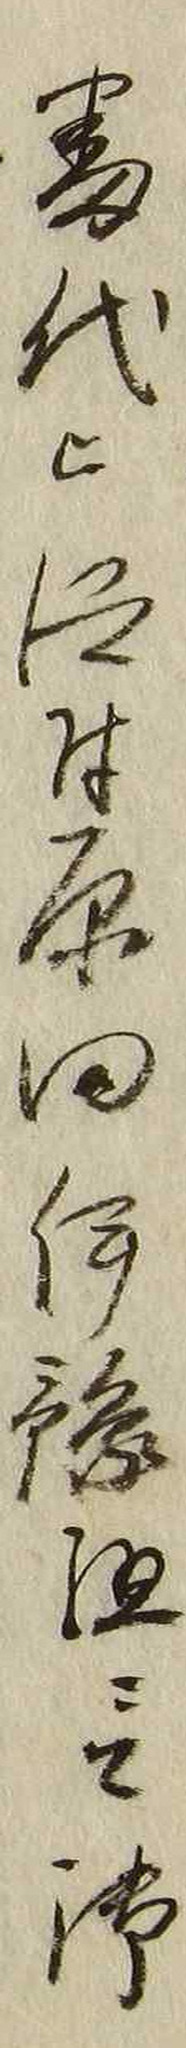番代被仰付原田伊予組ニて御
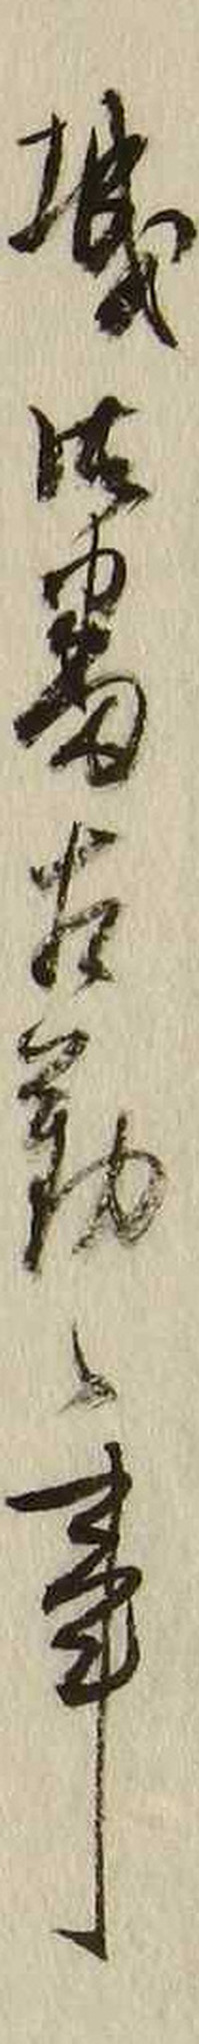城御番相勤候事
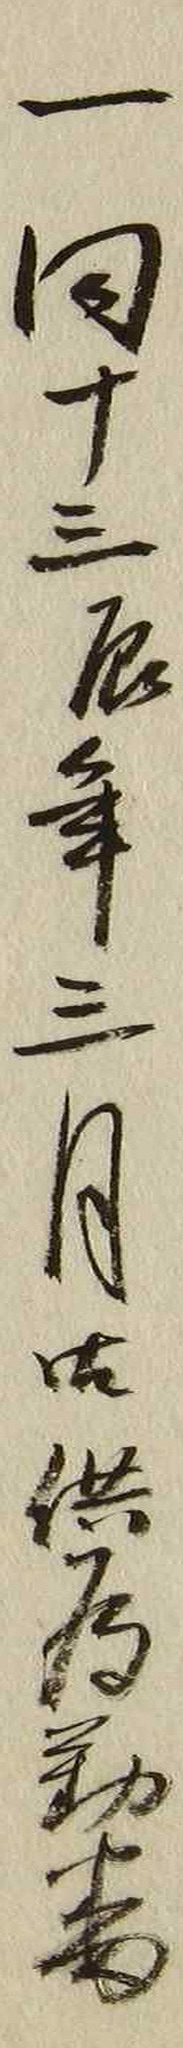一同十三辰年三月御供為勤番
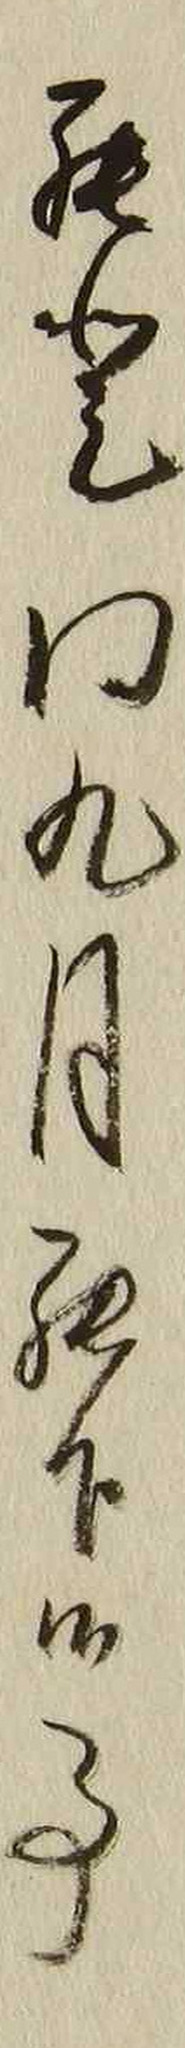罷登同九月罷下候事
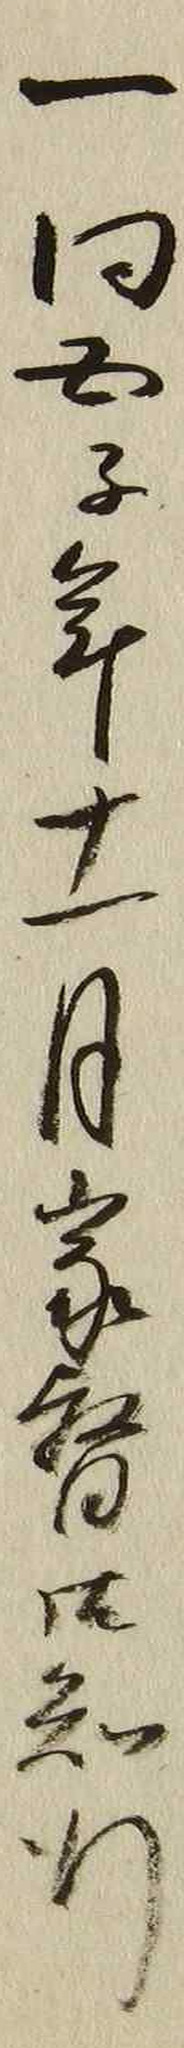一同五子年十一月家督御知行
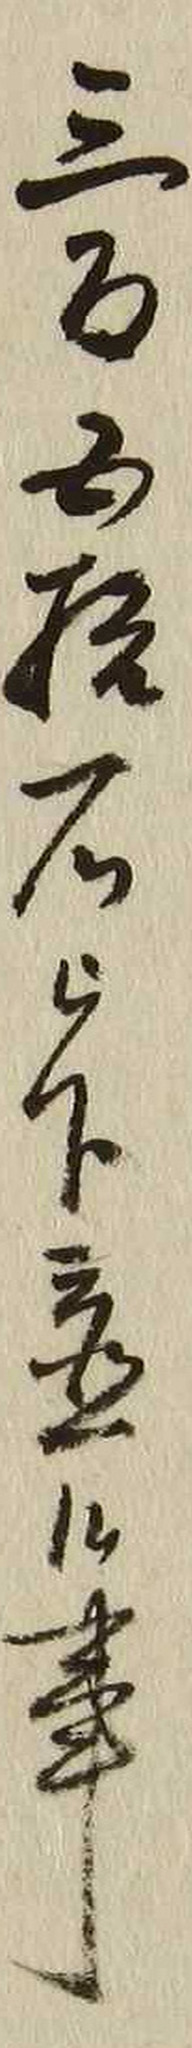三百五拾石被下置候事
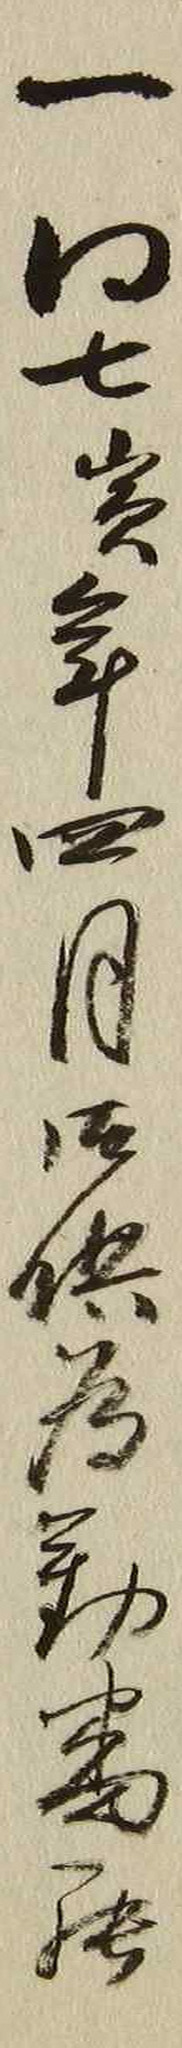一同七寅年四月御供為勤番罷
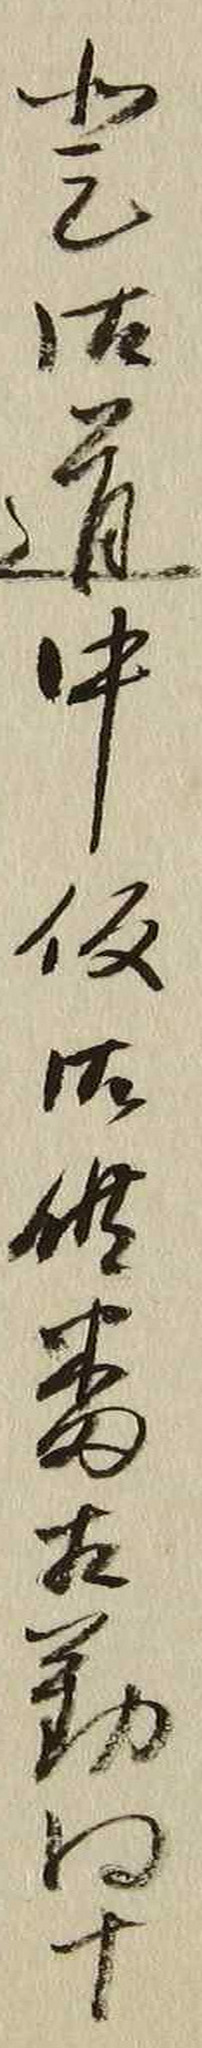登御道中仮御供番相勤同十
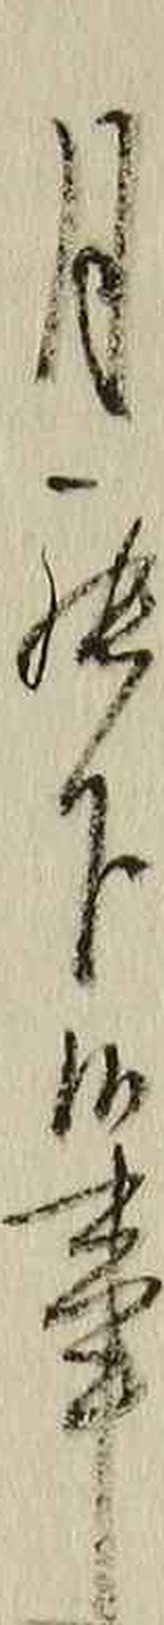月罷下候事
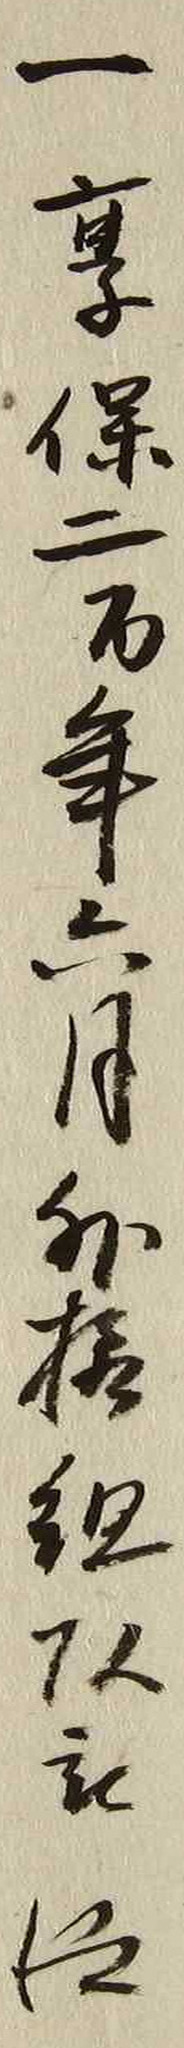一享保二酉年六月外様組頭被仰
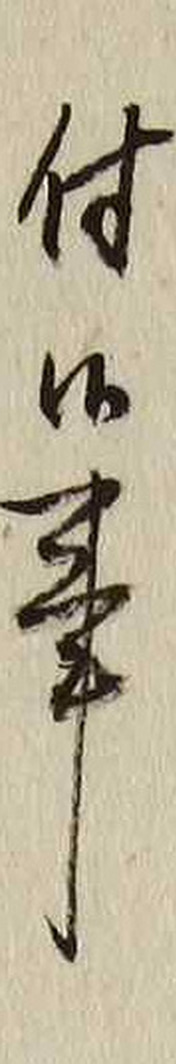付候事
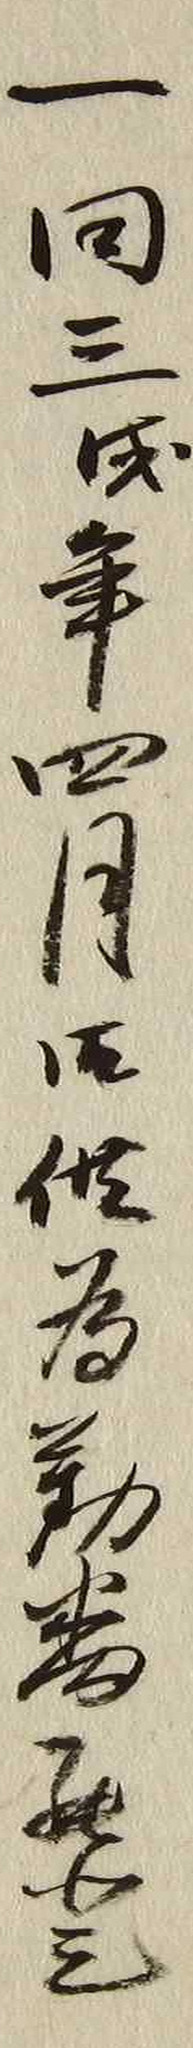一同三戌年四月御供為勤番罷登
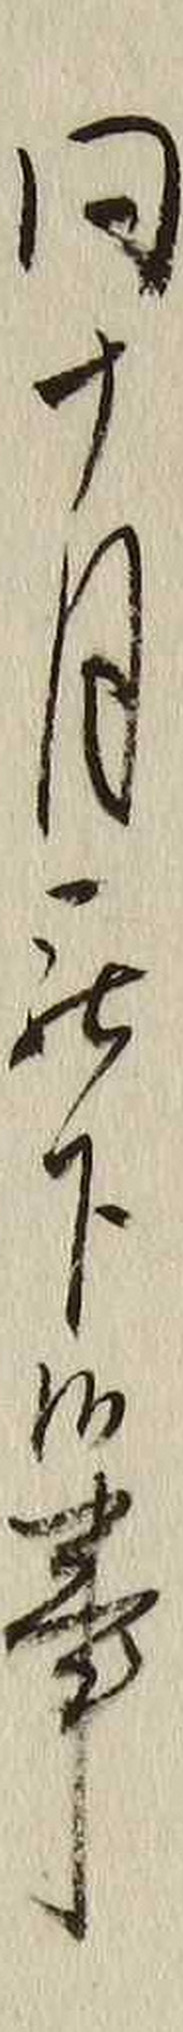同十月罷下候事
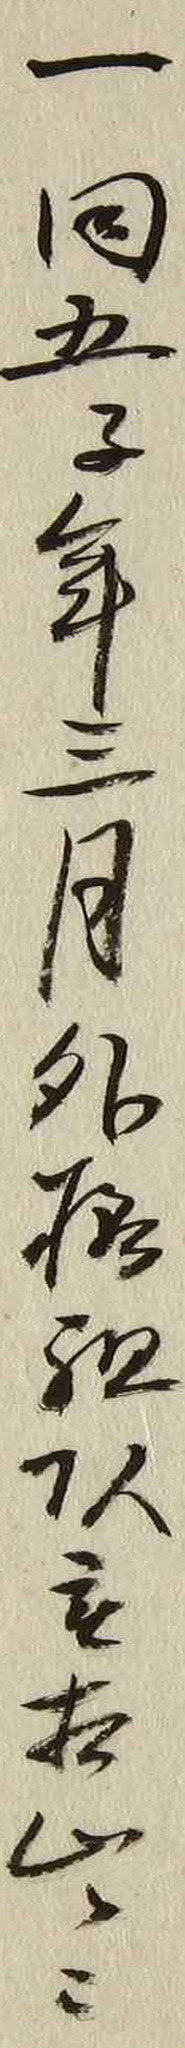一同五子年三月外様組頭被相止候ニ
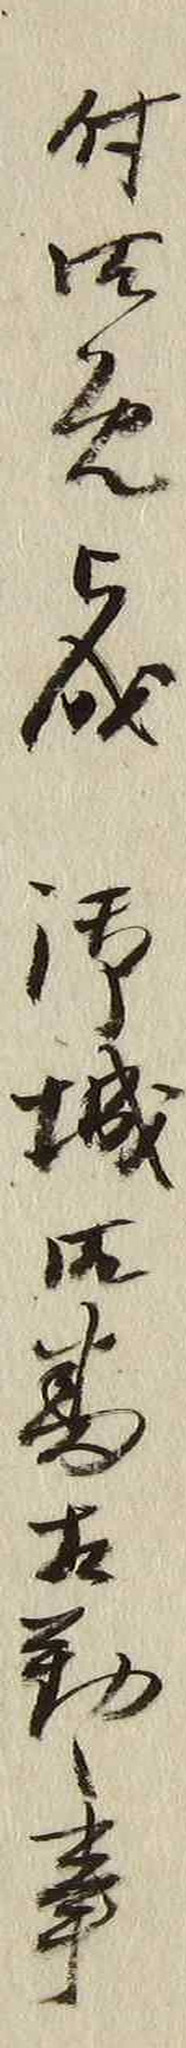付御免被成御城御番相勤候事
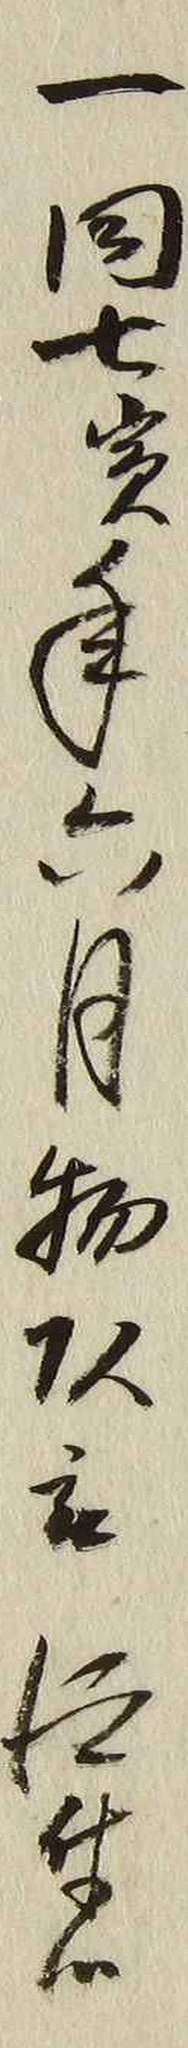一同七寅年六月物頭被仰付候
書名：諸士系譜　巻之356　す之部6
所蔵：会津若松市立会津図書館
